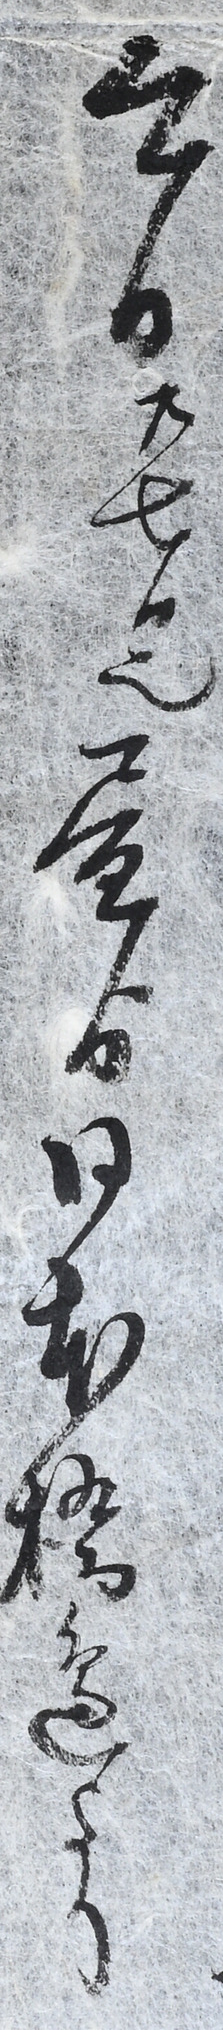今日廿七日也昼ゟ日本橋辺より
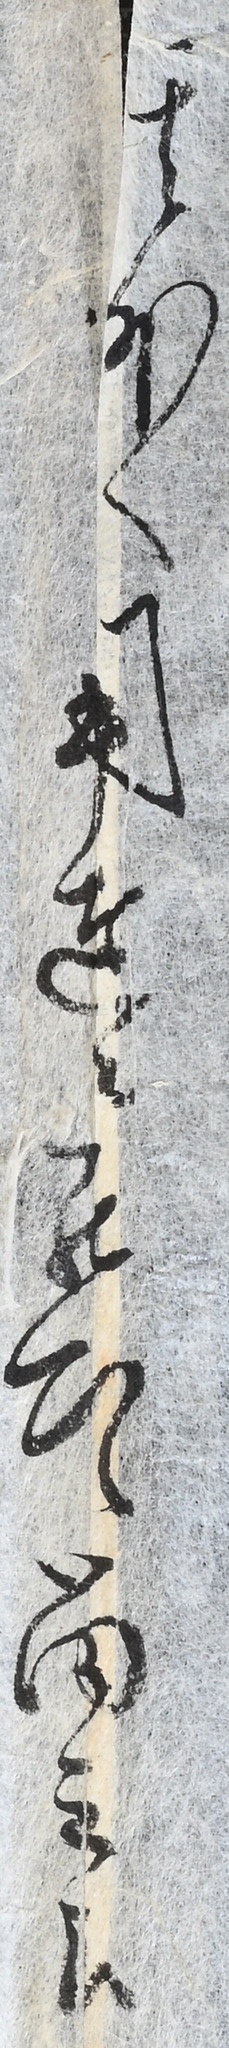其外へ用達ニ罷出候留主江
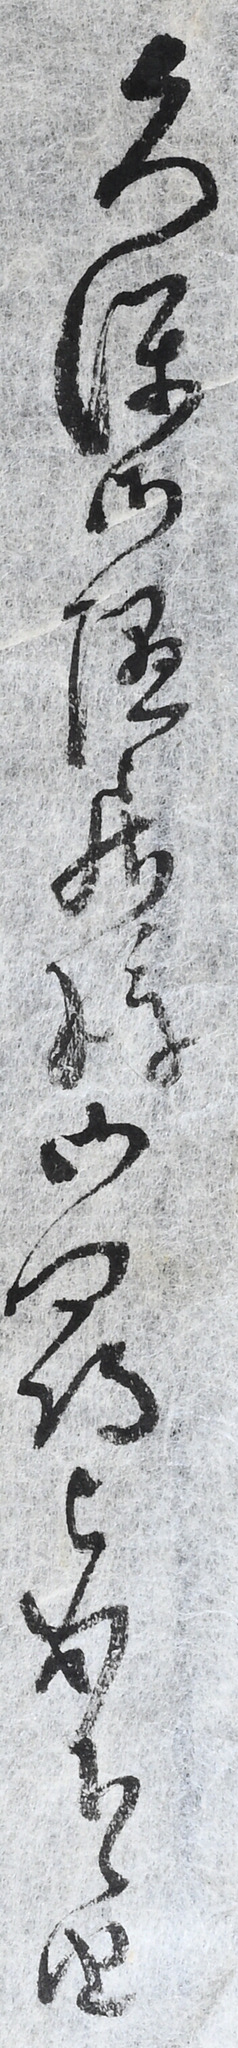久保御隠居様御尋被成下候由
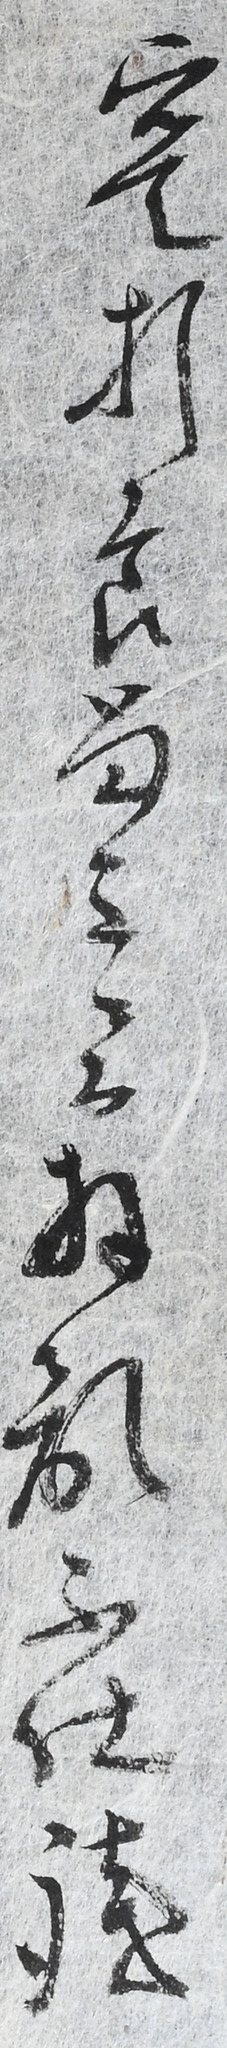寔折節留守ニ而拝顔不仕残
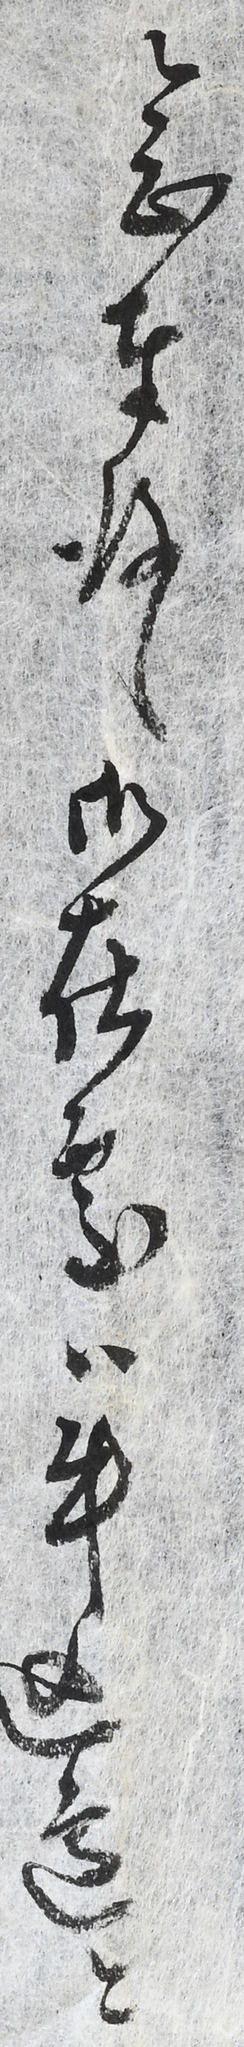念奉存候御在所処ハ牛込辺と
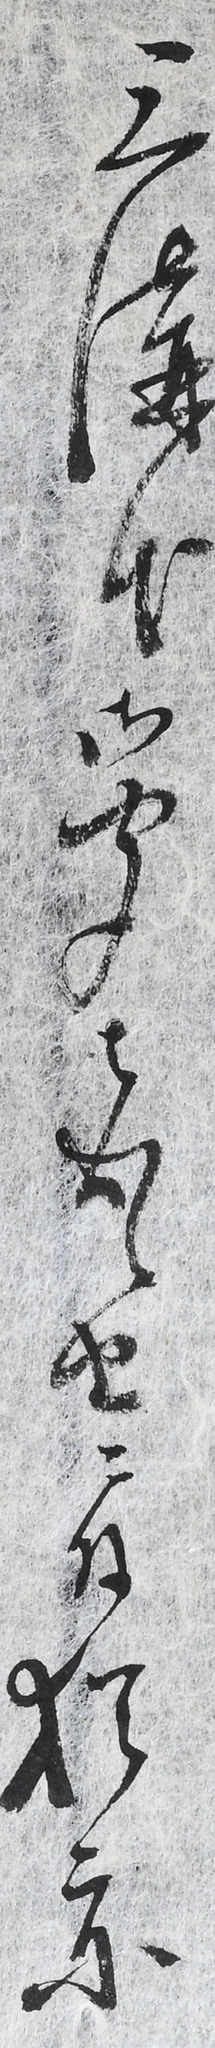三溝氏御聞被成候由ニ付猶亦
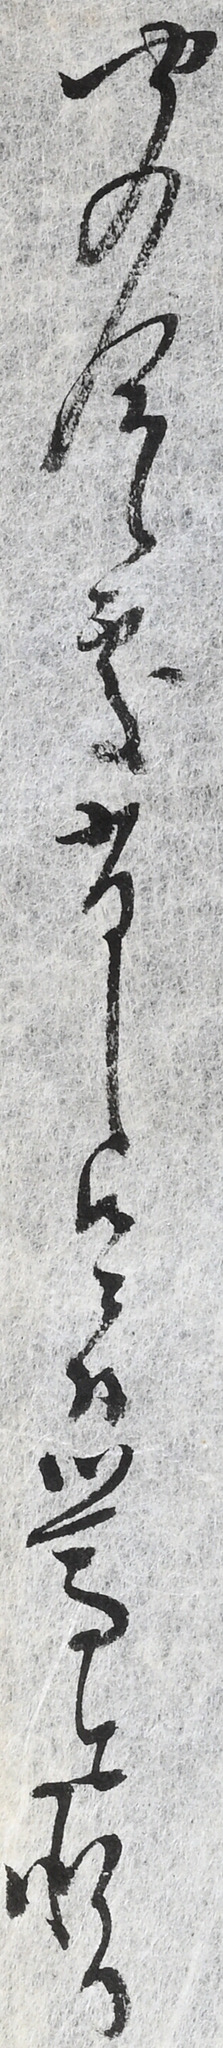聞合候処有之候ニ付篤と承り
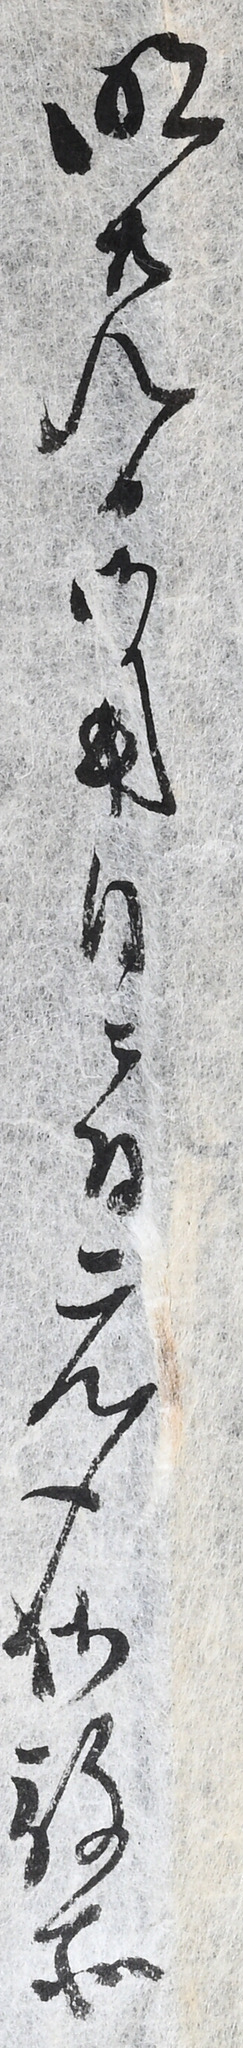明廿八日御用日ニ付元〆御役所
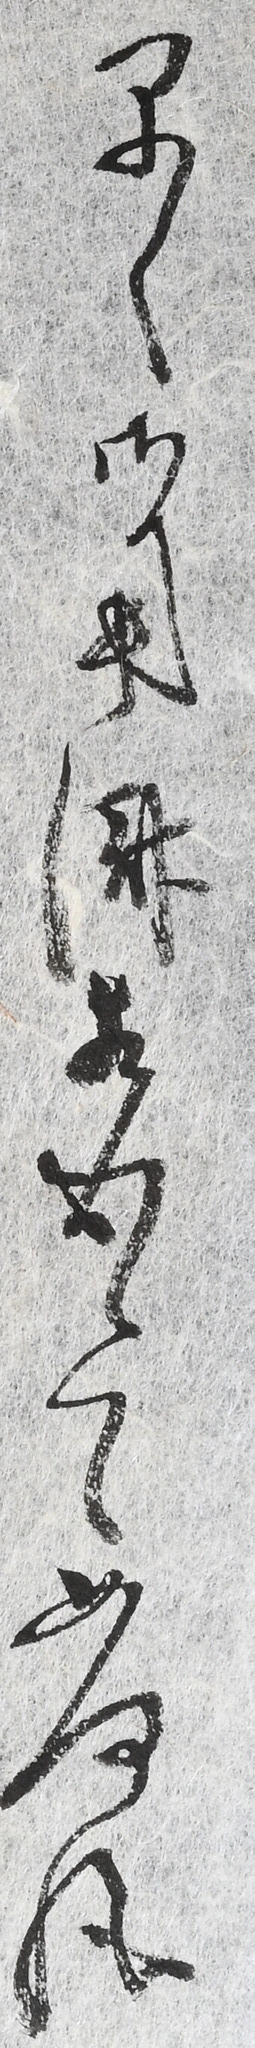早々御用済相成候ハヽ如何様
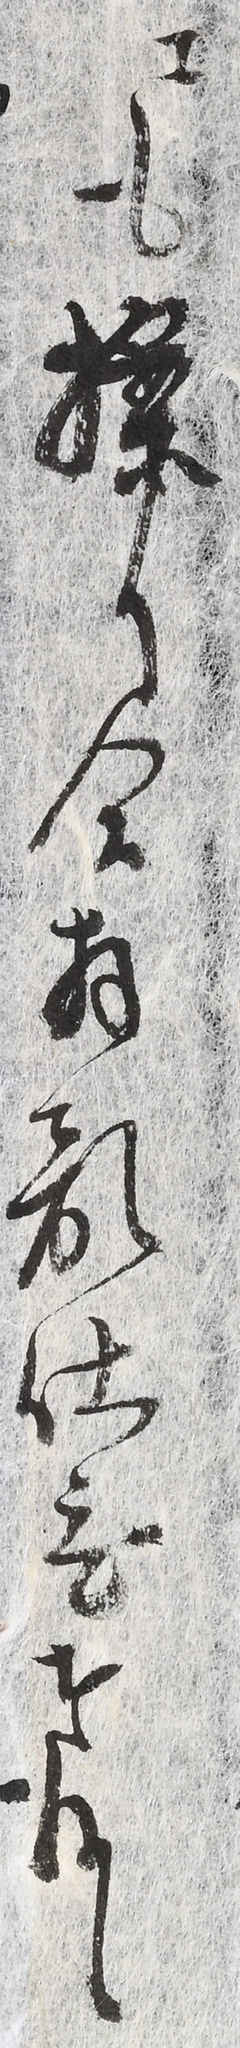ニも擦り合拝顔仕度奉存候
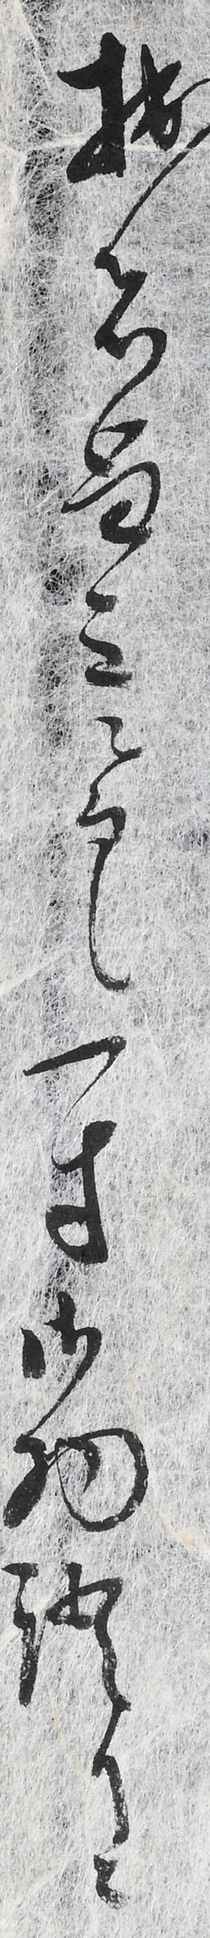拙者留主ニ而候一寸御物語りニ
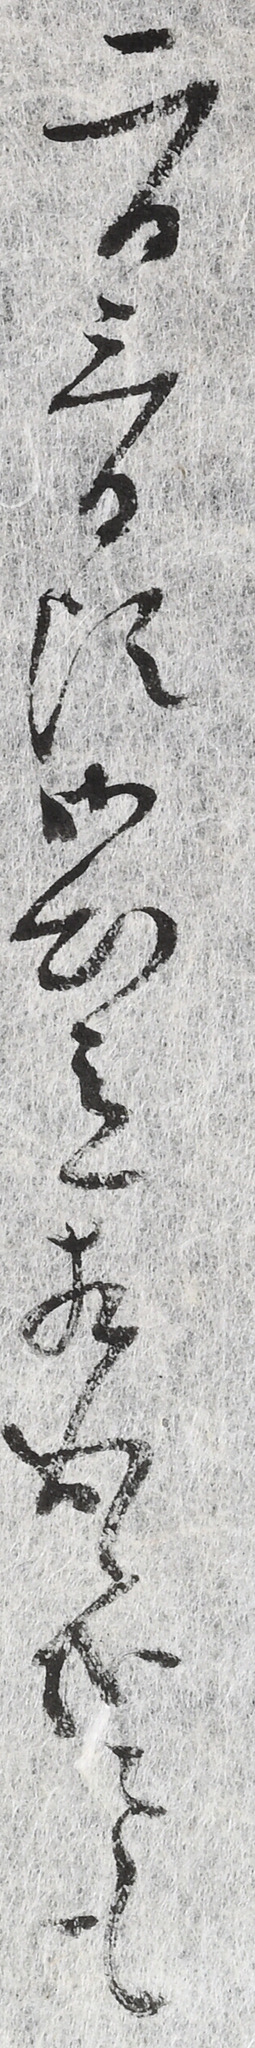二日三日頃御出立相成候哉ニも
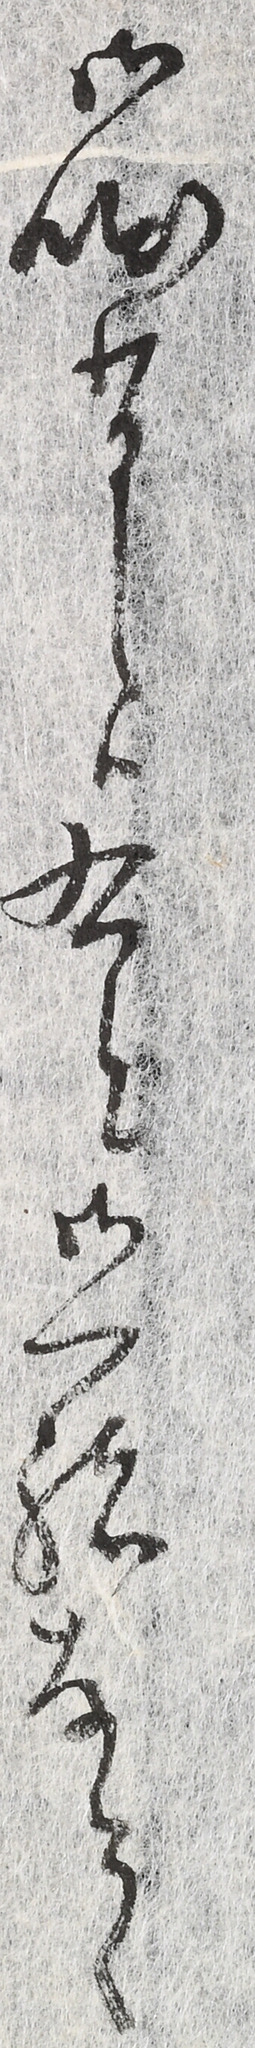御咄有之候右ニ御一緒なとゝ
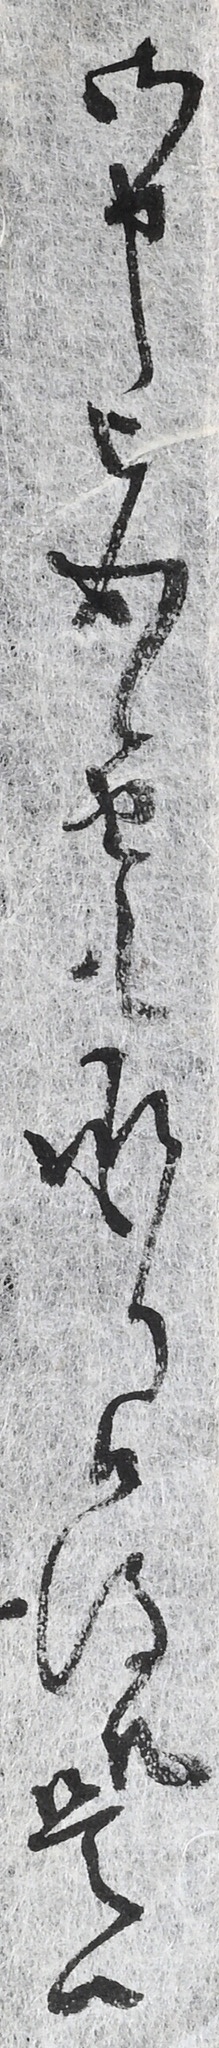御申被成候由も承り候得共是ハ
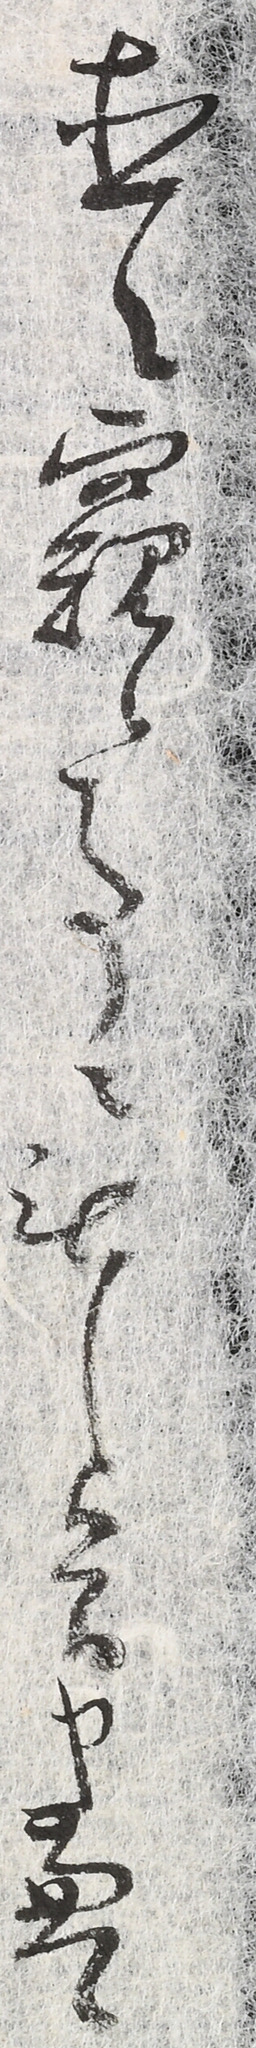直ニ窺候事ニ無之候間申兼候
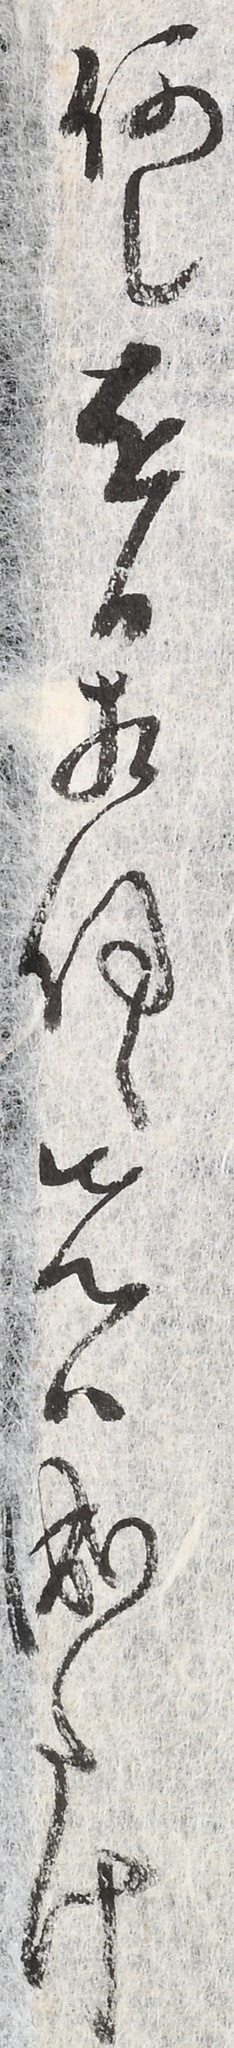何レ近日相伺候先ハ成たけ
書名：（書状）
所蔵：伊那市立高遠町図書館・合同会社AMANE
